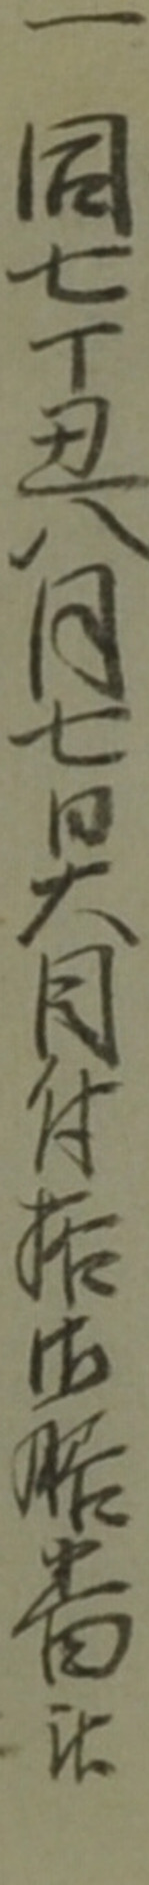一同七丁丑八月七日大目付格御膳番被
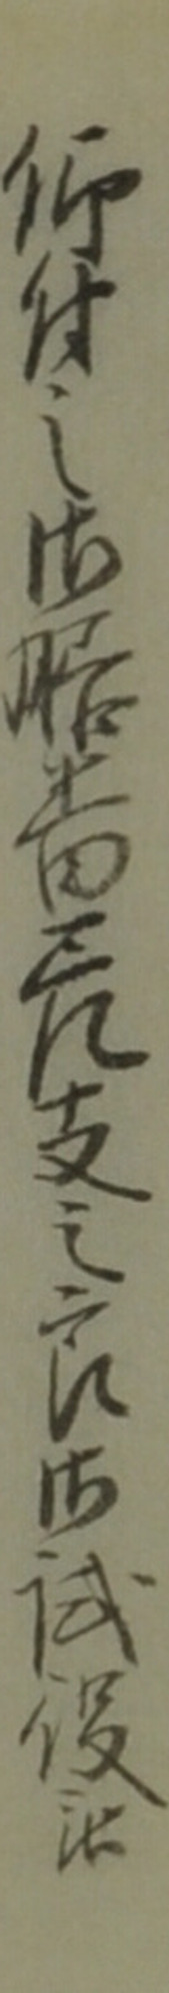仰付之御膳番差支之節御試役被
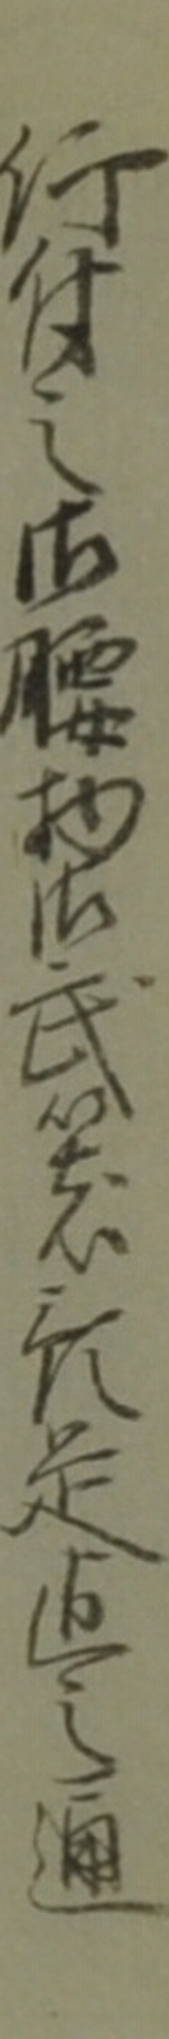仰付之御腰物御武器頭是迄之通
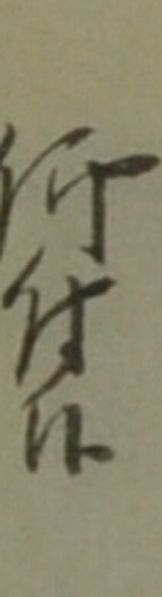仰付候
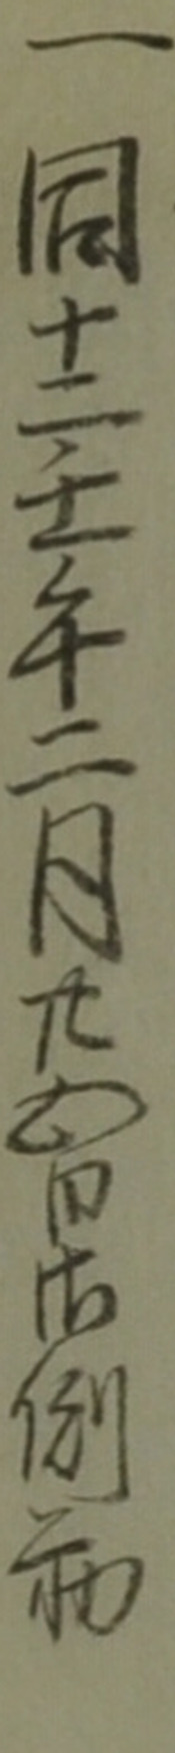一同十二壬午二月廿五日御側勤
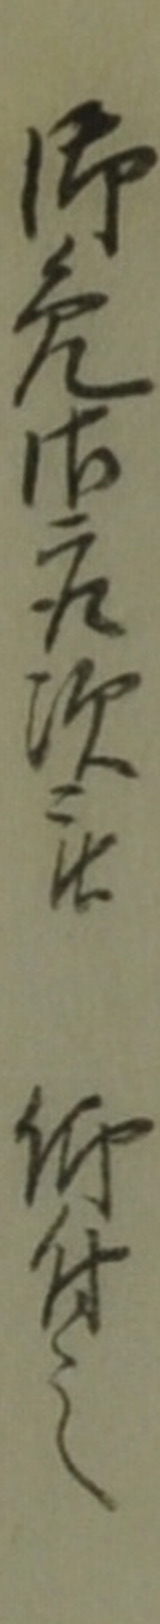御免御取次被仰付之
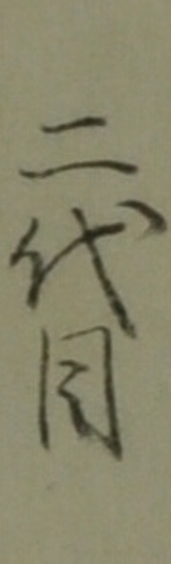二代目
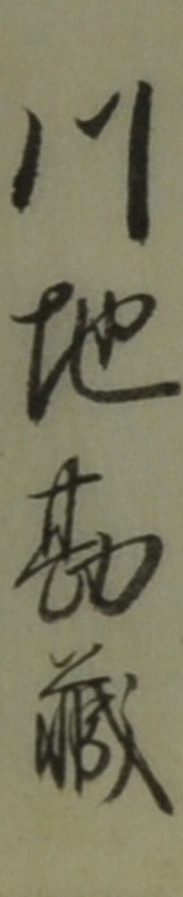川地勘蔵
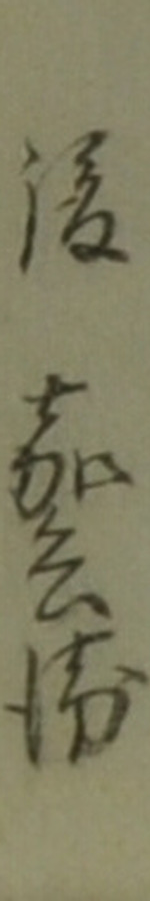後嘉兵衛
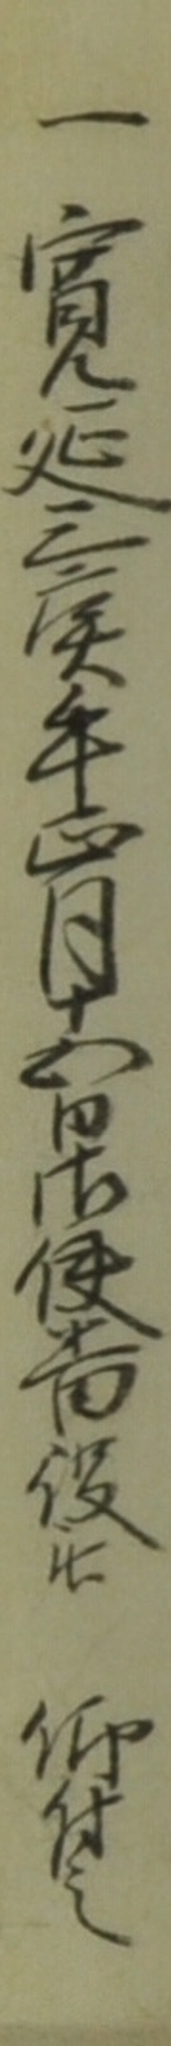一寛延三庚午正月十五日御使番役被仰付之
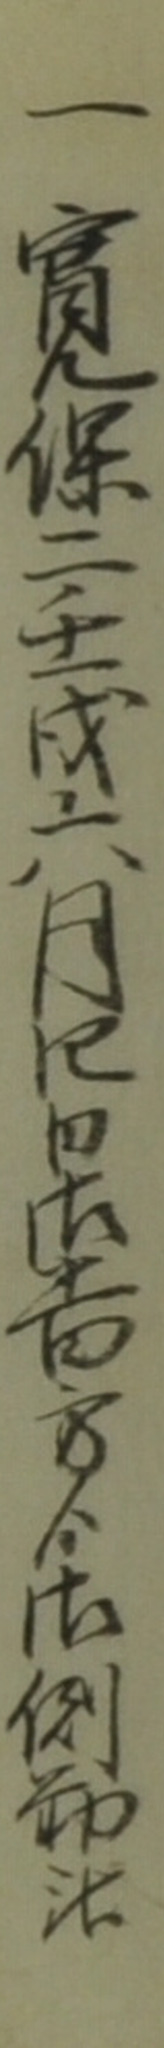一寛保二壬戌六月四日御番方ゟ御側勤被
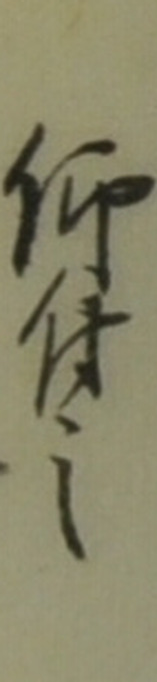仰付之

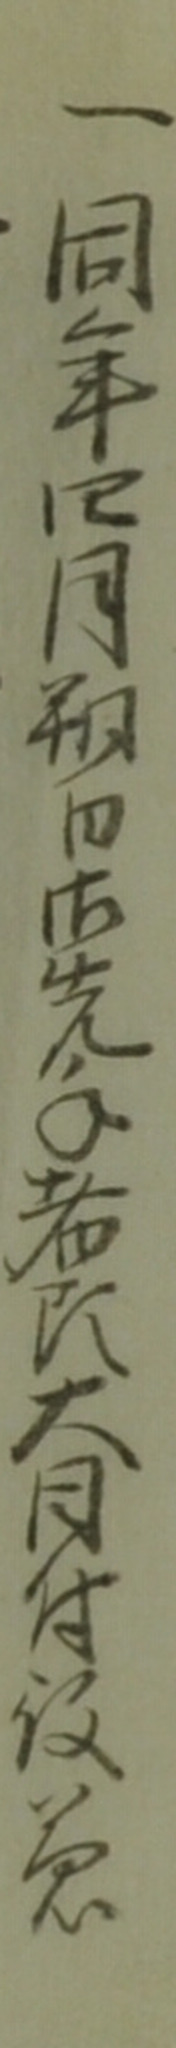一同年四月朔日御先手者頭大目付役兼
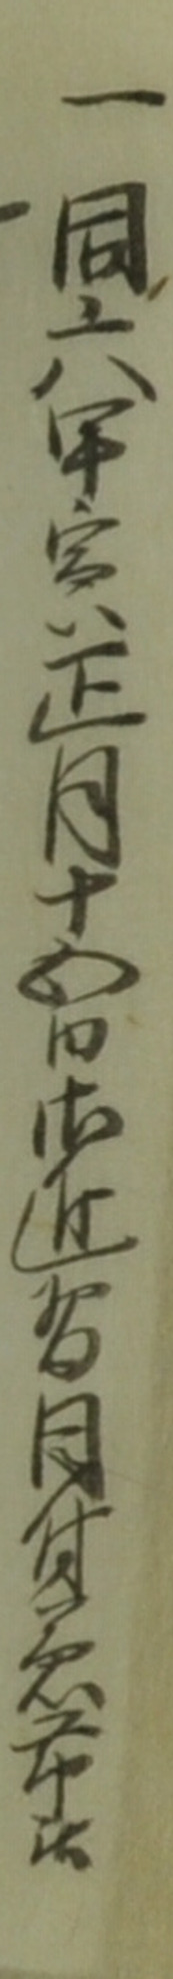一同六甲寅正月十五日御近習目付兼帯被
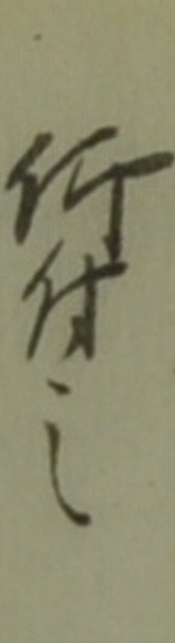仰付之
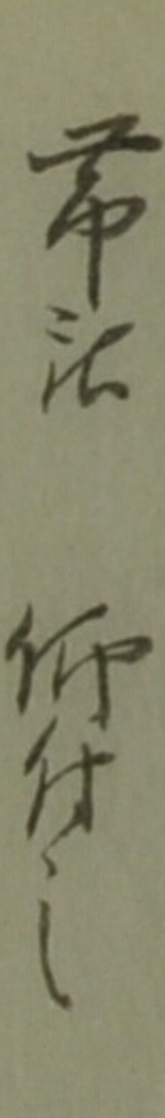帯被仰付之
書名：諸御役代々録（五）
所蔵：伊那市立高遠町図書館・合同会社AMANE
